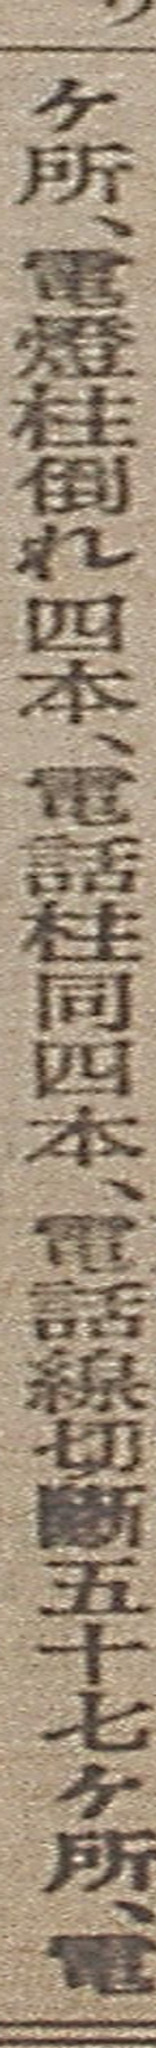ケ所、電燈柱倒れ四本、電話柱同四本、電話線切断五十七ケ所、電
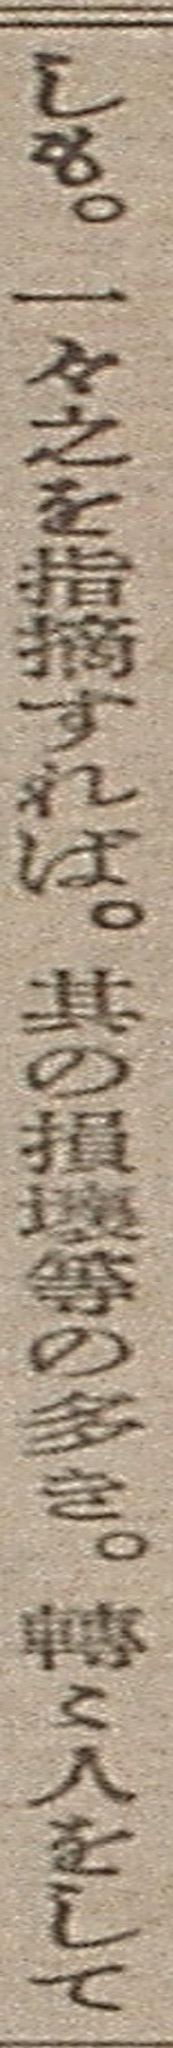しも。一々之を指摘すれば。其の損壊等の多き。転々人をして
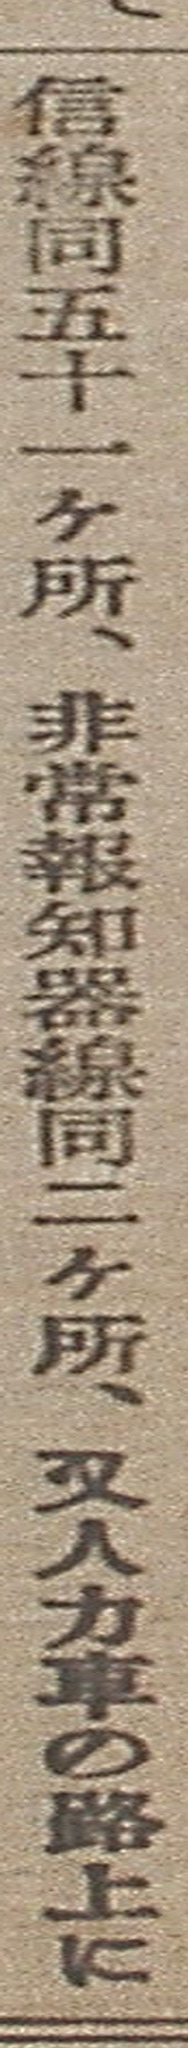信線同五十一ケ所、非常報知器線同二ケ所、又人力車の路上に
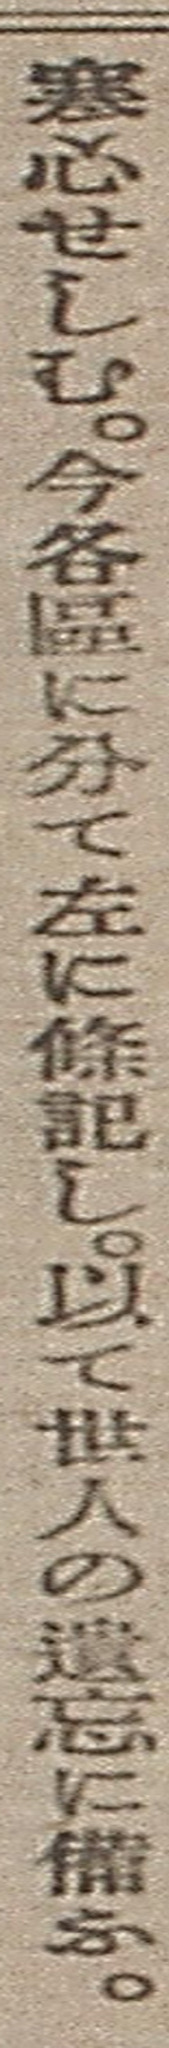寒心せしむ。今各区に分て左に条記し。以て世人の遺忘に備ふ。
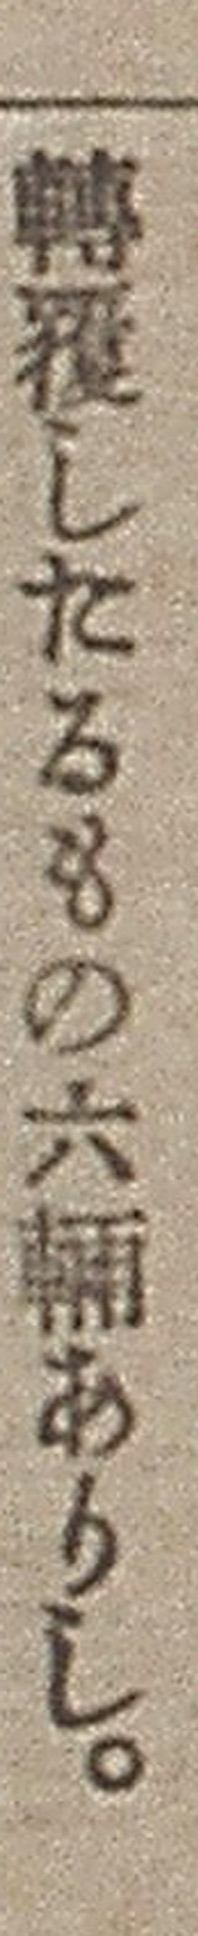転覆したるもの六輌ありし。
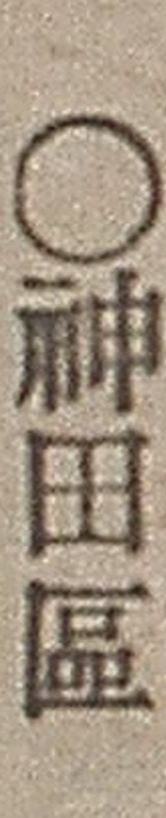〇神田区
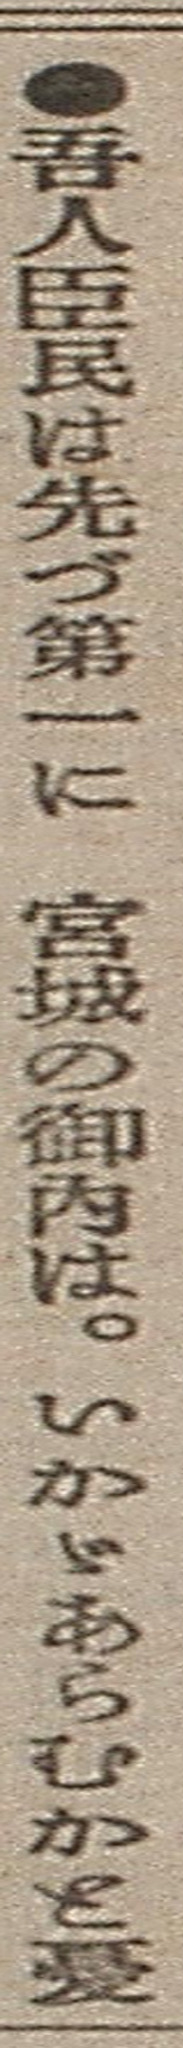●吾人臣民は先づ第一に宮城の御内は。いかゞあらむかと憂
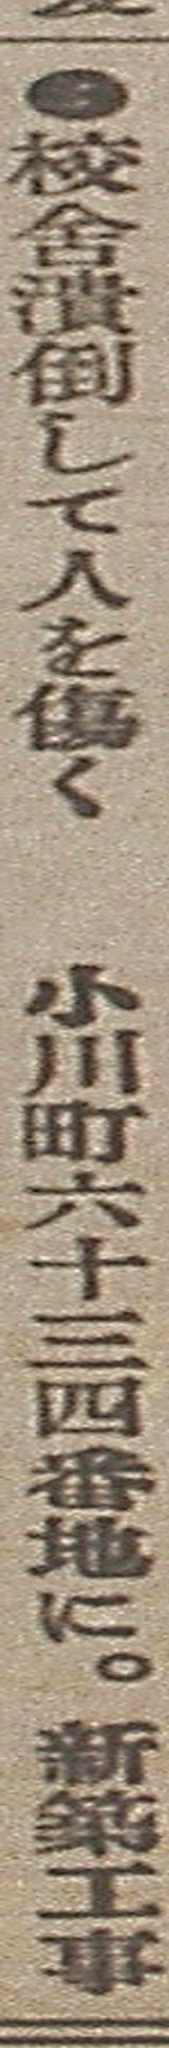●校舎潰倒して人を傷く小川町六十三四番地に。新築工事
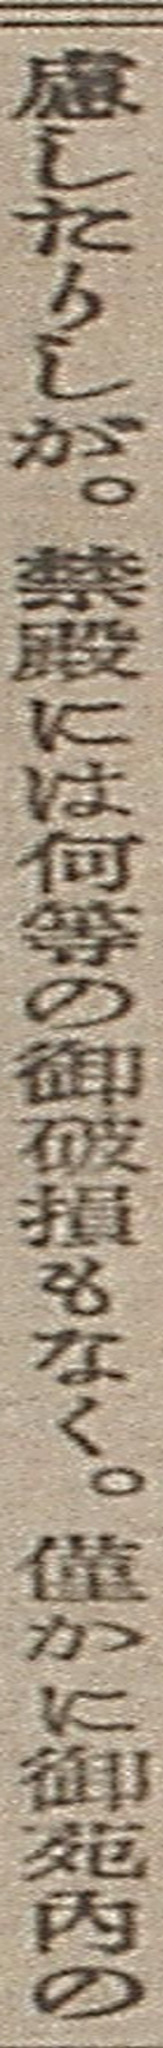慮したりしが。禁殿には何等の御破損もなく。僅かに御苑内の
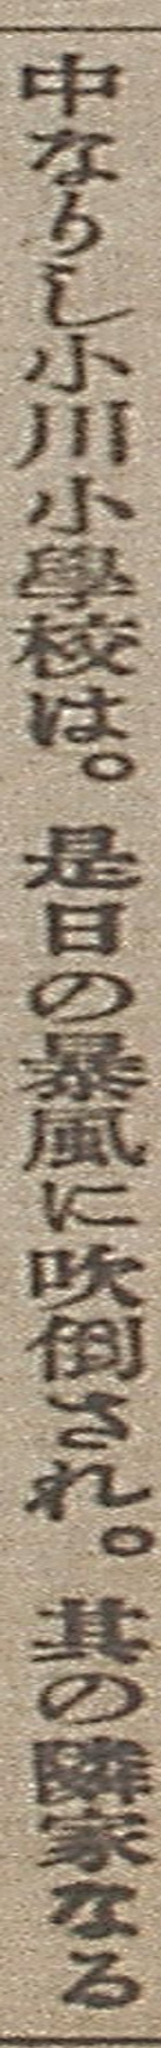中なりし小川小学校は。是日の暴風に吹倒され。其の隣家なる
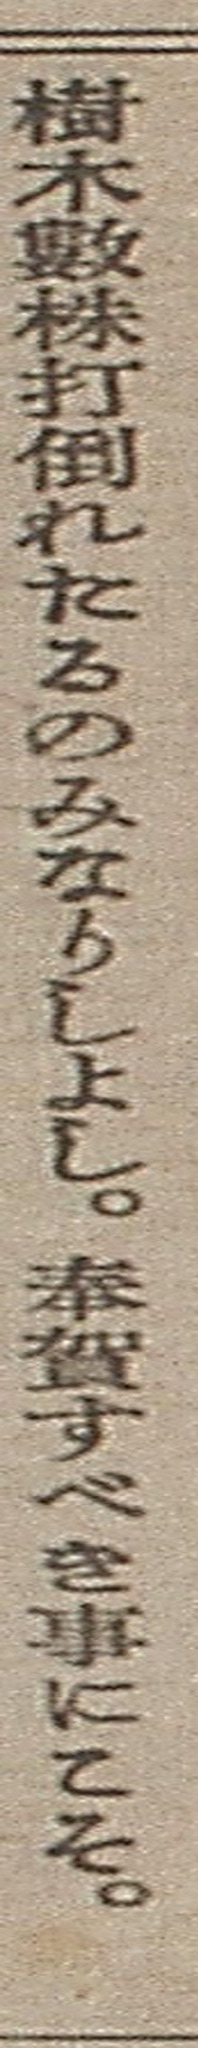樹木数株打倒れたるのみなりしよし。奉賀すべき事にこそ。
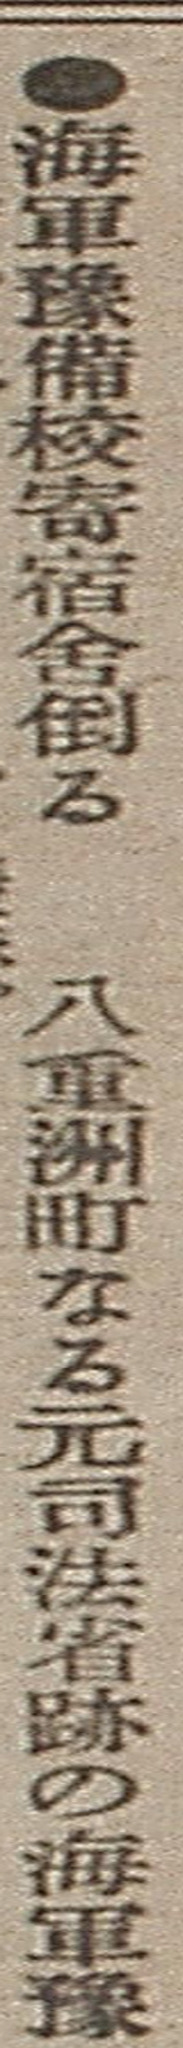●海軍予備校寄宿舎倒る八重洲町なる元司法省跡の海軍予
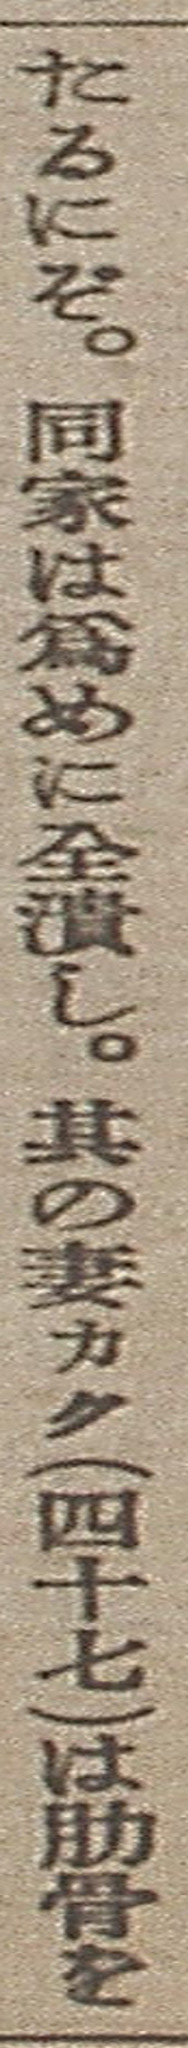たるにぞ。同家は為めに全潰し。其の妻カクは肋骨を
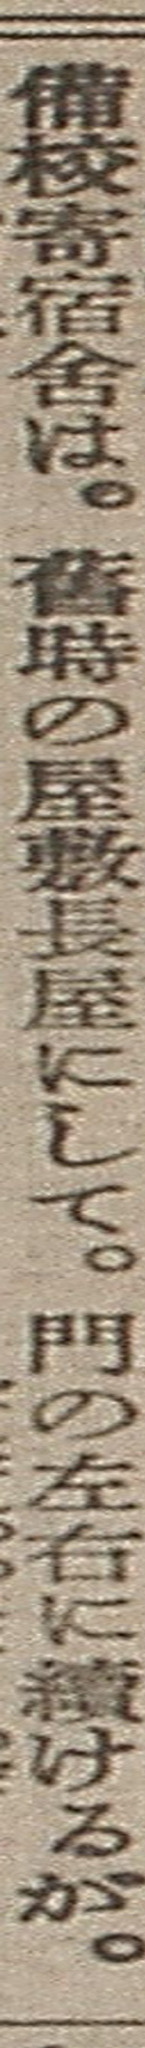備校寄宿舎は。旧時の屋敷長屋にして。門の左右に続けるが。
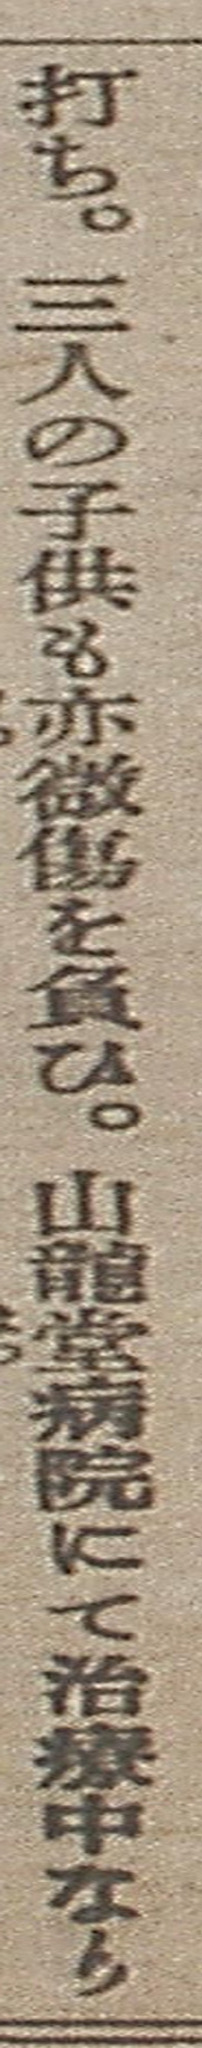打ち。三人の子供も亦微傷を負ひ。山龍堂病院にて治療中なり
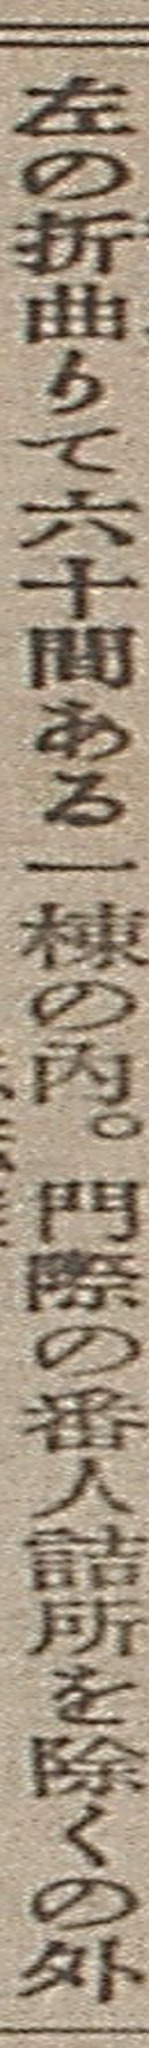左の折曲りて六十間ある一棟の内。門際の番人詰所を除くの外
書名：風俗畫報臨時増刊第百九十九號　明治三十二年十月各地災害圖會（前編之續）
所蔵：東京大学地震研究所図書室 Earthquake Research Institute Library, The University of Tokyo, JAPAN
